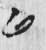㠯（以）
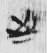至（致）
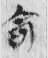命
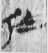於
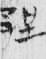郢
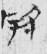阩
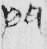門
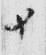又
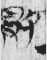敗
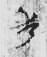秀
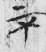不
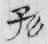孫
